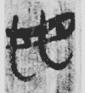母（毋）
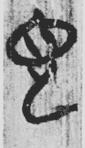見
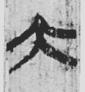大
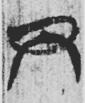尹
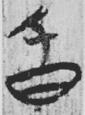昏（聞）
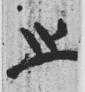之
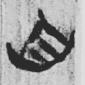自
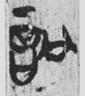訟
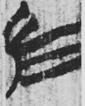於
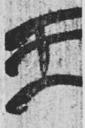王
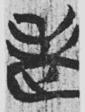老
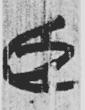臣
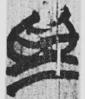爲
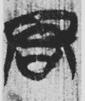君
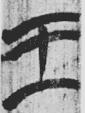王
